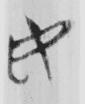女
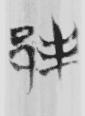邦
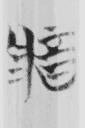𨟻
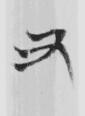又
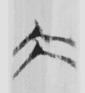大
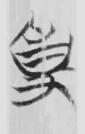事
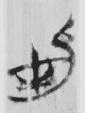{才匕}
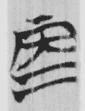再
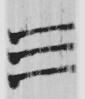三
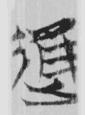進
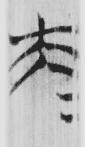夫=
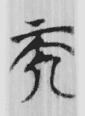而
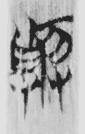與
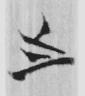之
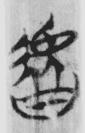{虍皆}
